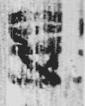是
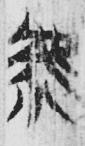{虍介}（乎）
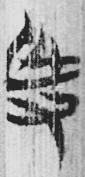拃（作）
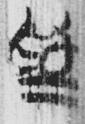爲
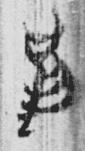革
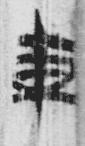車
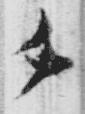千
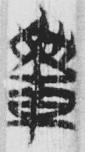𨌤
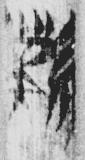○（帶）
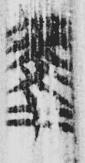○（甲）
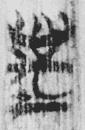○（萬）
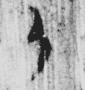人
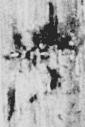戊
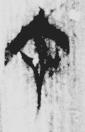午
